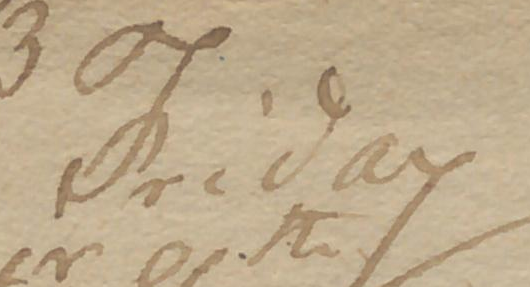Friday
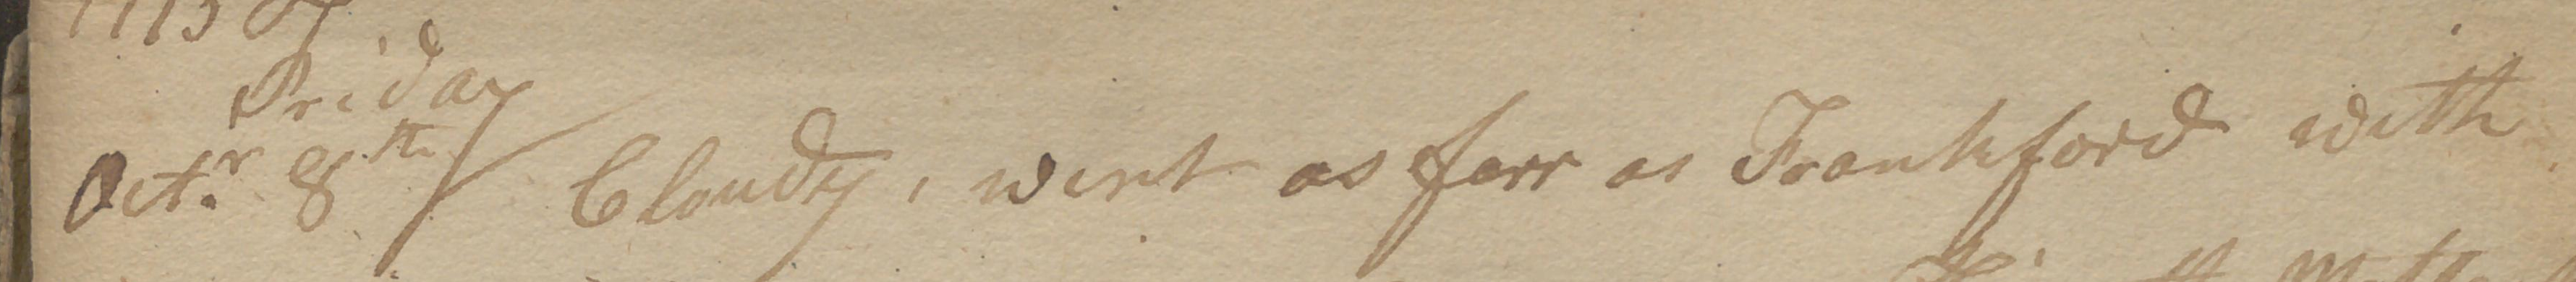Oct^r. 8^th Cloudy, went as farr as Frankford with
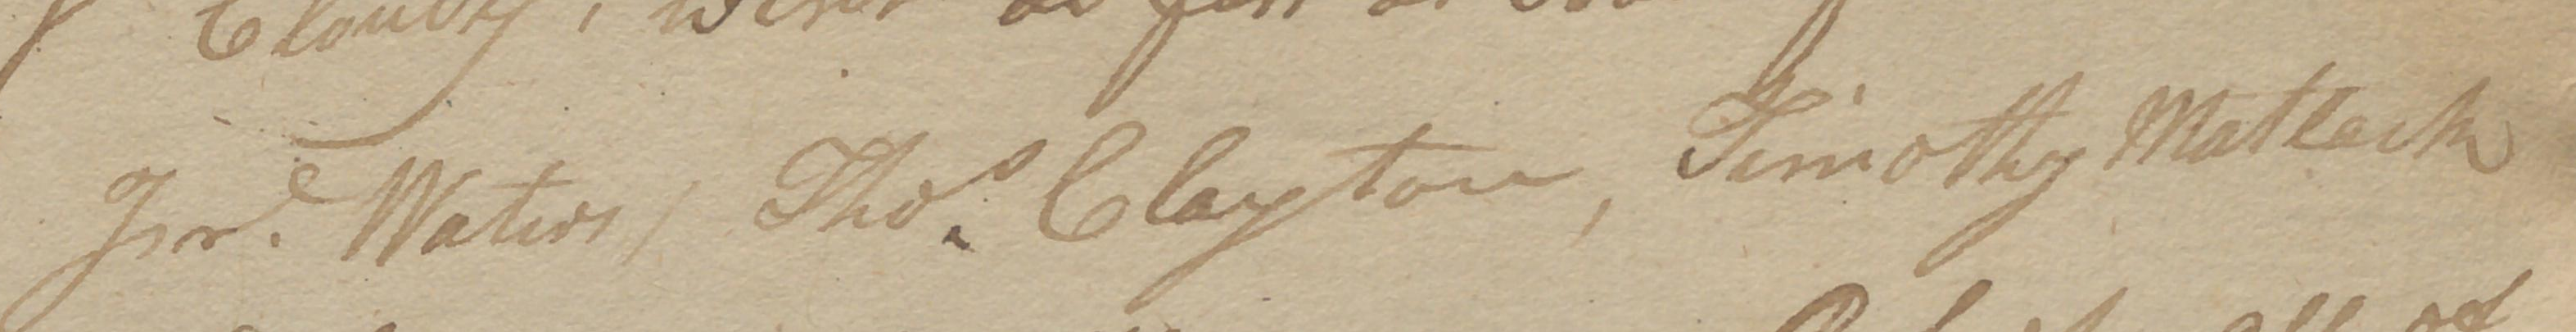Isr^l. Waters Tho^s. Clayton, Timothy Matlack
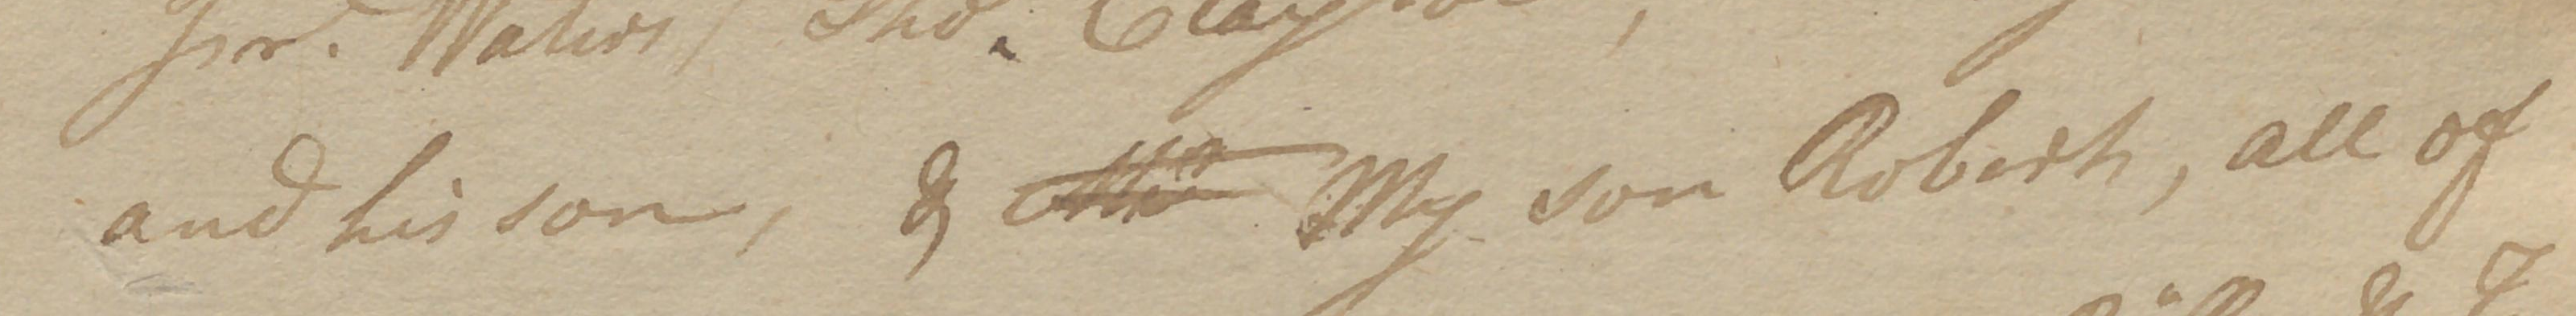and his son, & [M^r] My son Robert, all of
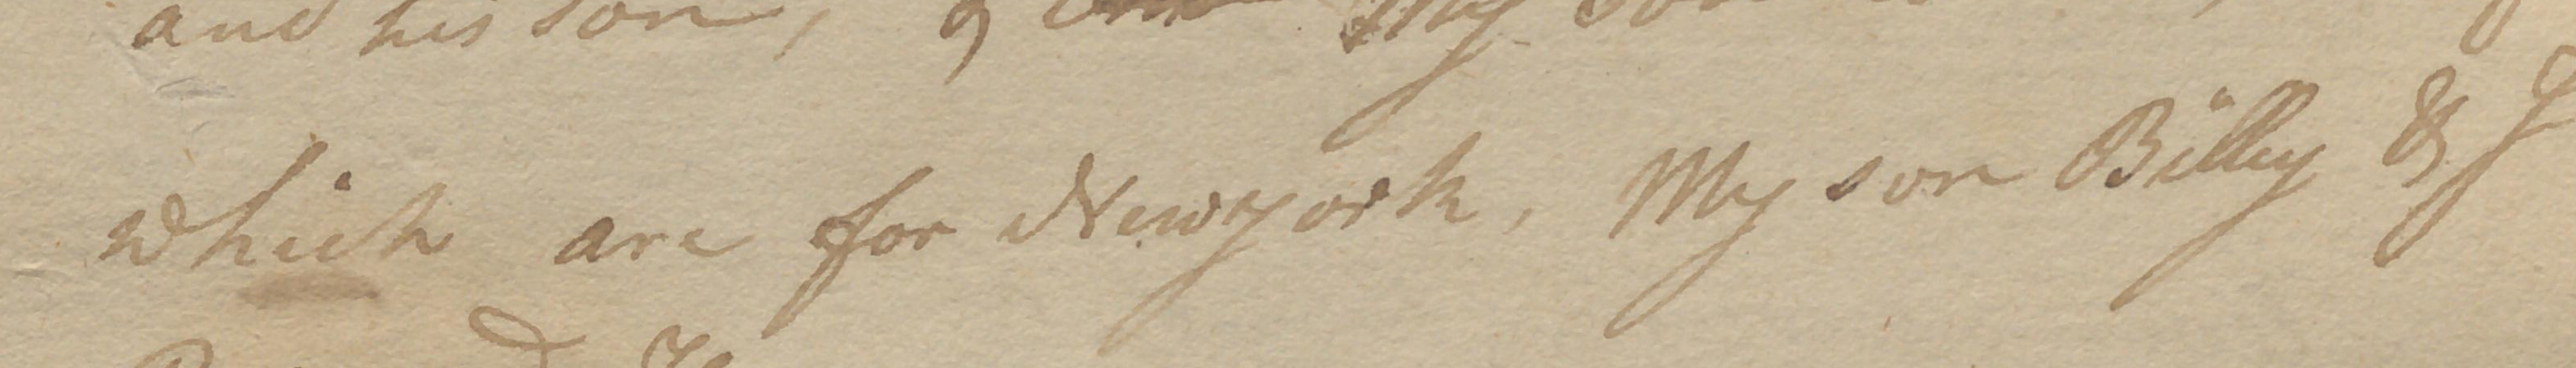which are for Newyork. My son Billy & I
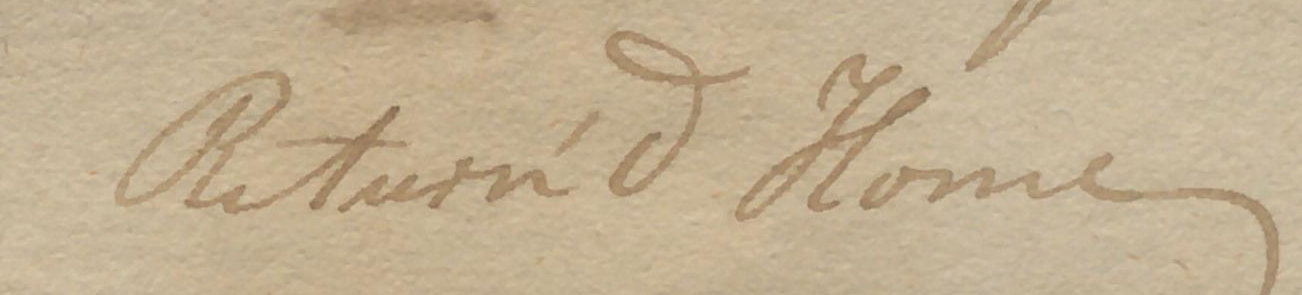Return'd Home
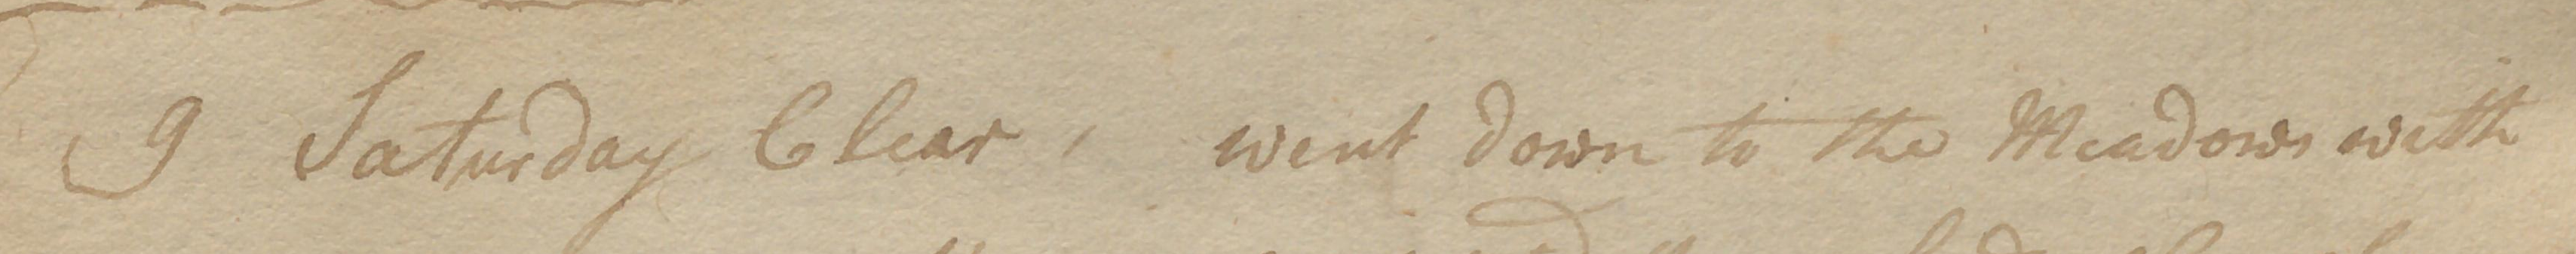9 Saturday Clear, went down to the Meadows with
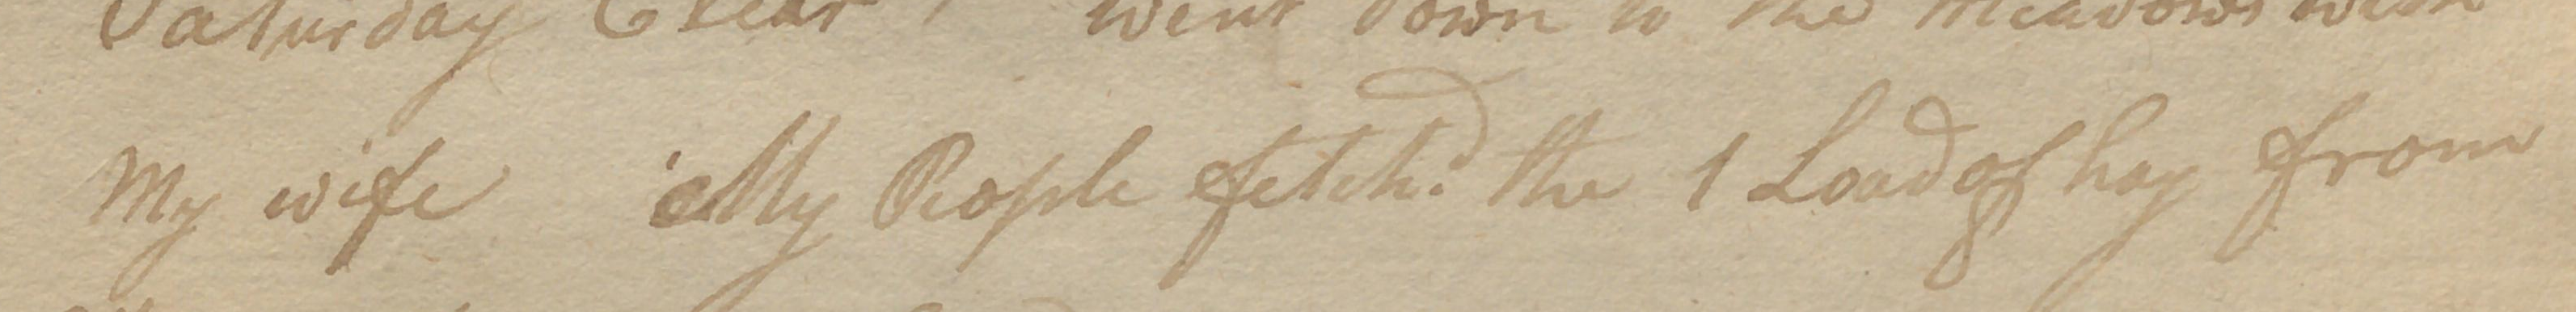My wife My People fetch^d. the 1 Load of hay from
